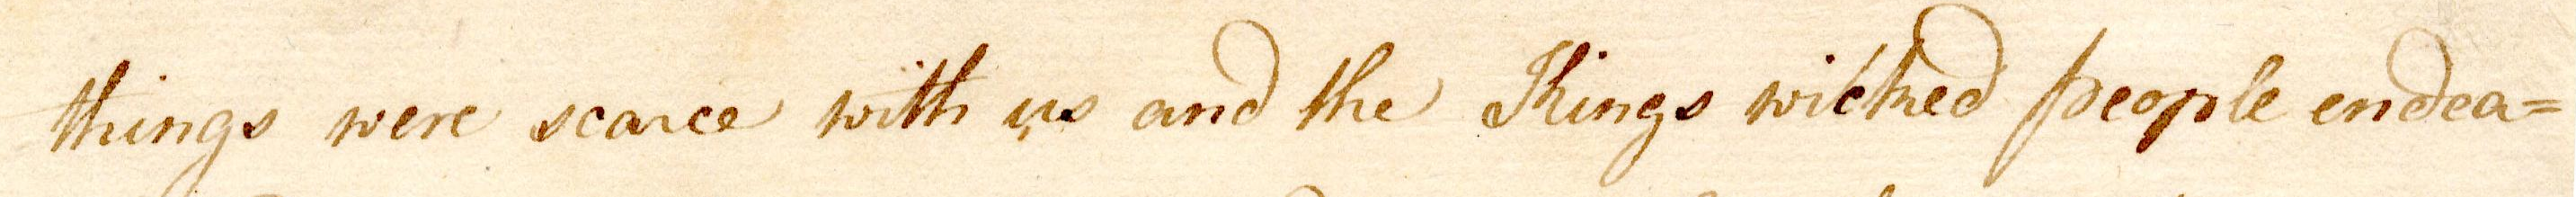things were scarce with us and the Kings wicked people endea-
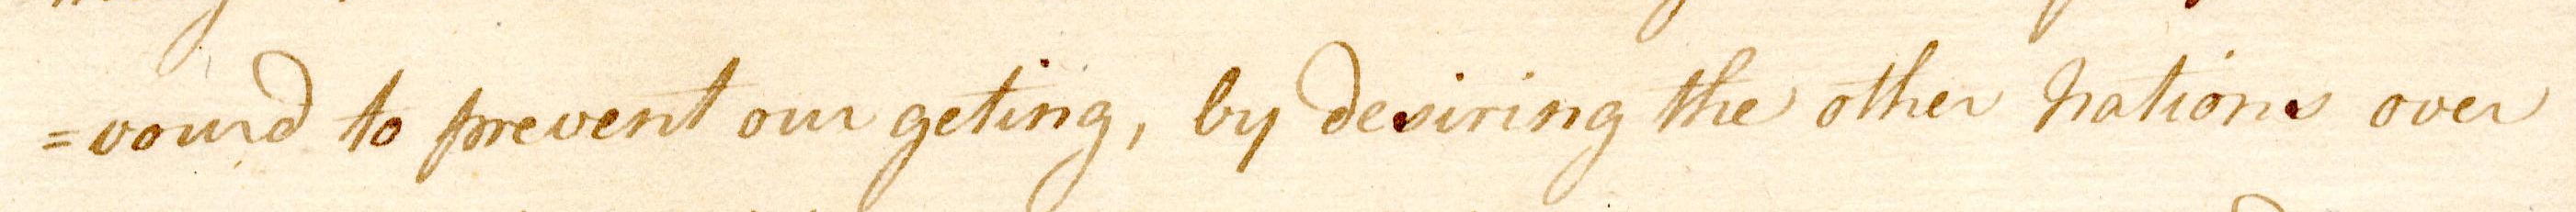-vourd to prevent our geting, by desiring the other Nations over
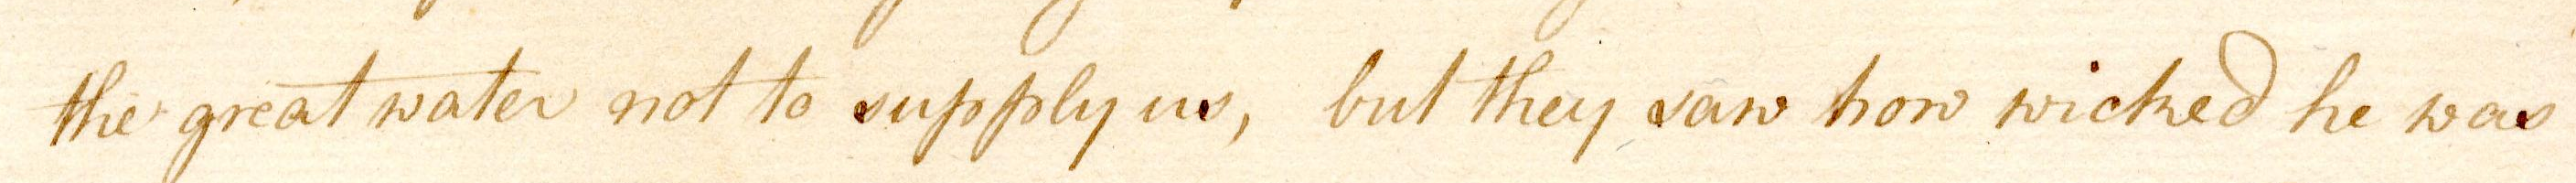the great water not to supply us, but they saw how wicked he was
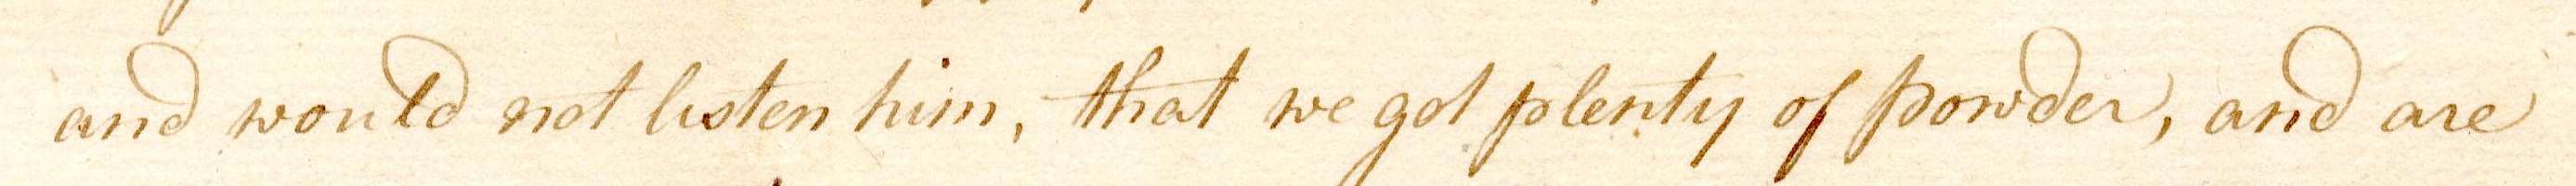and would not listen him, that we got plenty of powder, and are
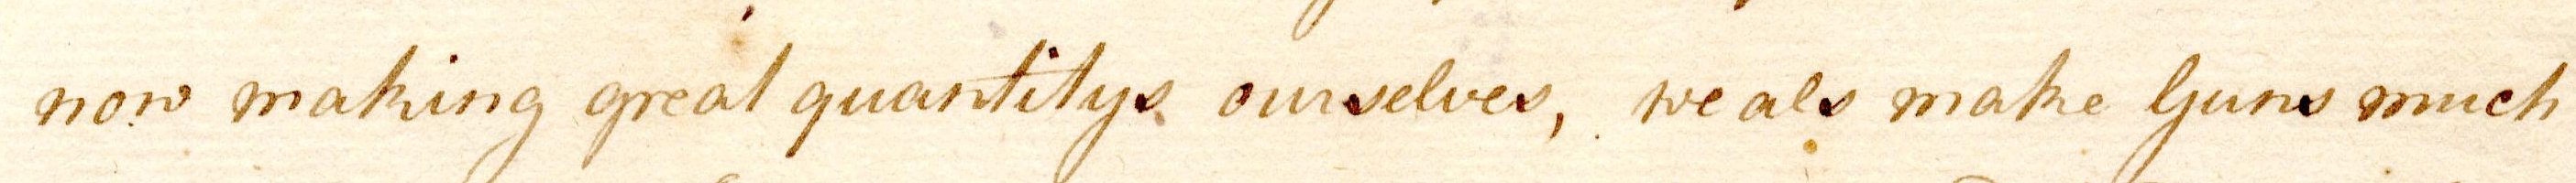now making great quantitys ourselves, we also make Guns much
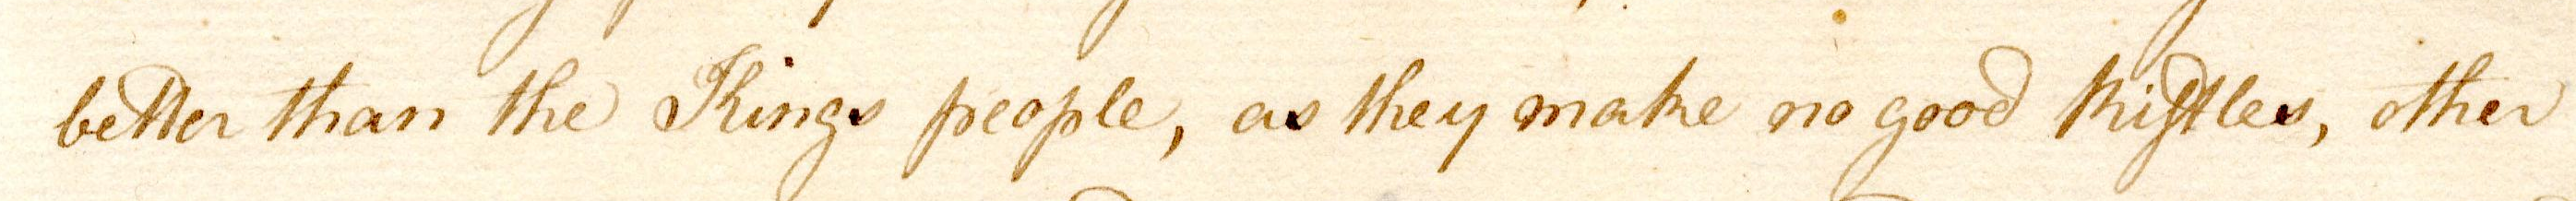better than the Kings people, as they make no good Rifles, other
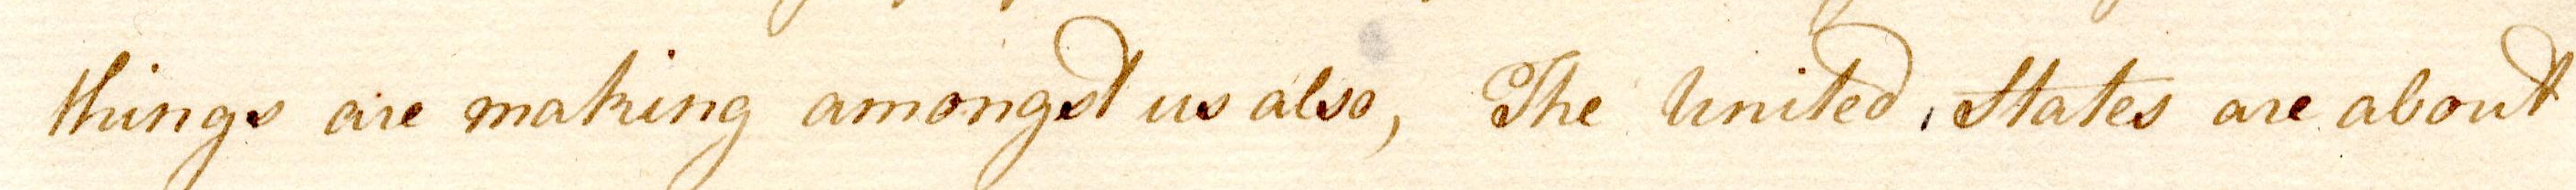things are making amongst us also, The united, States are about
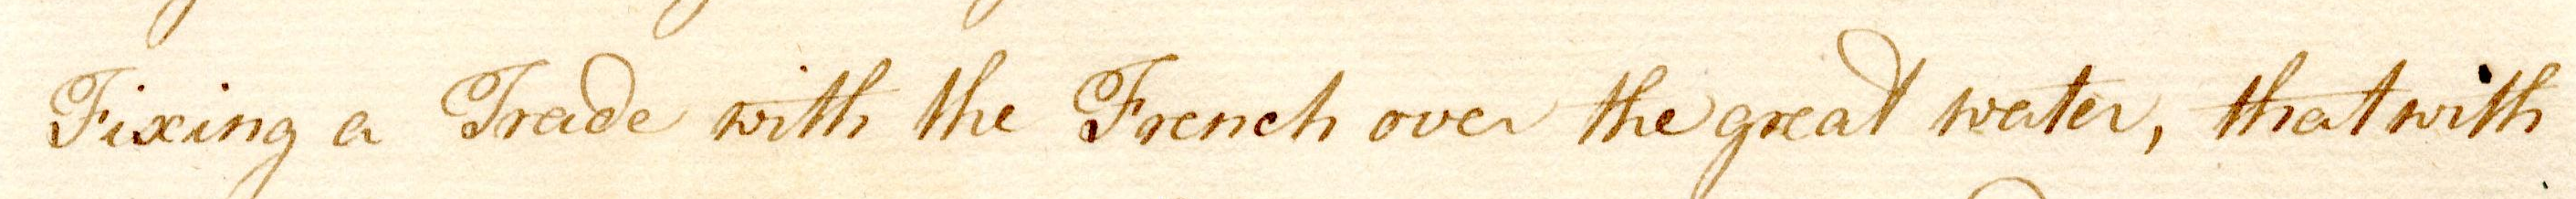Fixing a Trade with the French over the great water, that with
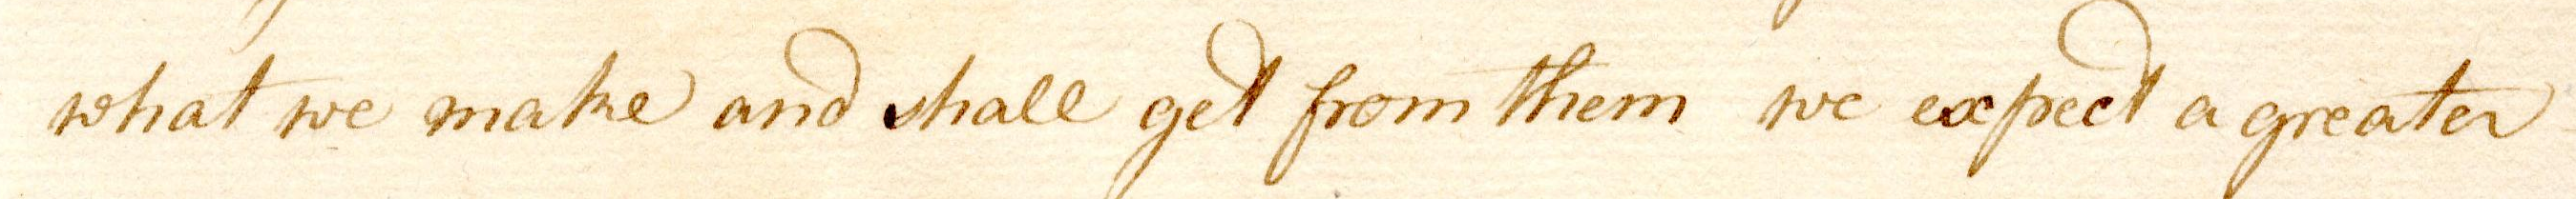what we make and shall get from them we expect a greater
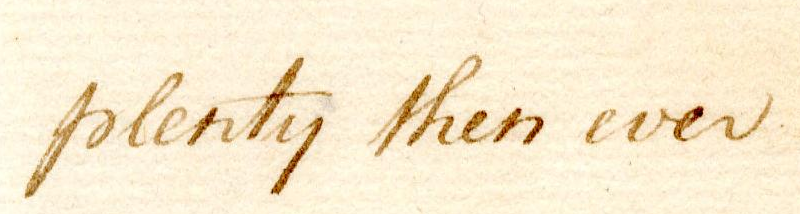plenty then ever-
